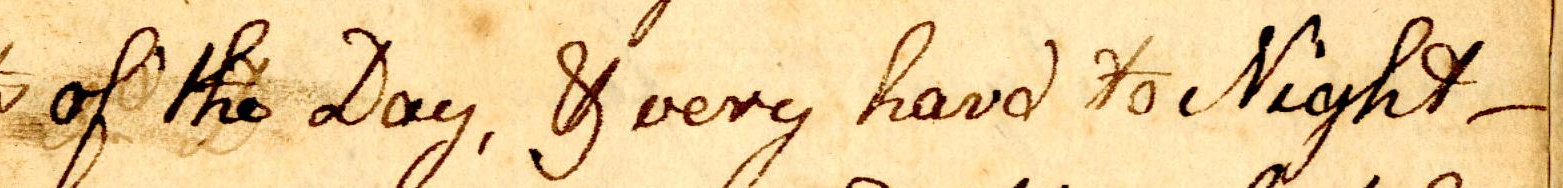of the Day, & very hard to Night
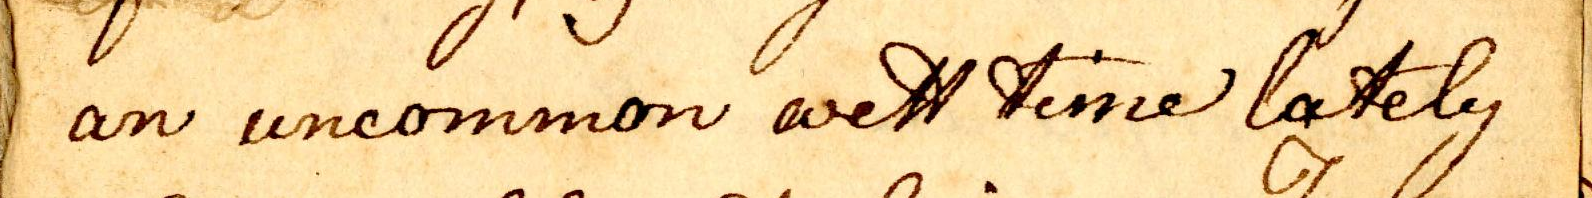an uncommon wett time lately
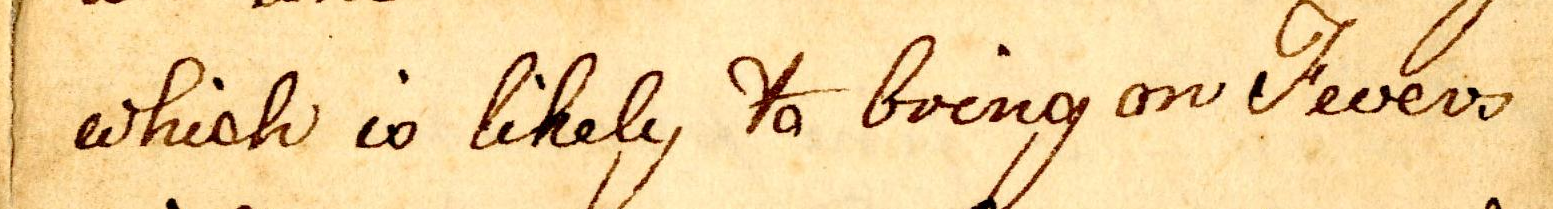which is likely to bring on Fevers
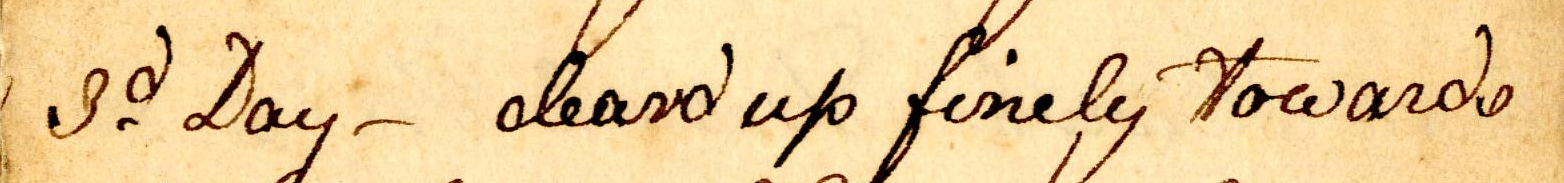3^d. Day- cleard up finely towards
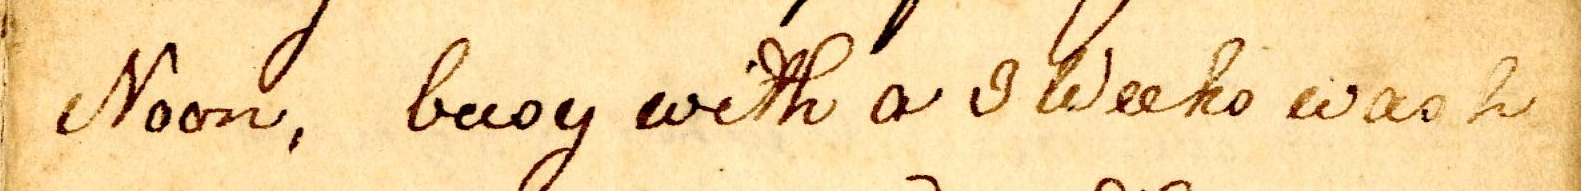Noon, busy with a 3 Weeks wash
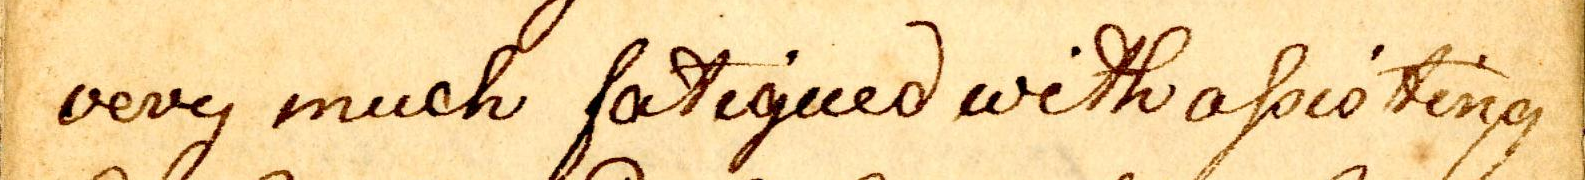very much fatigued with assisting
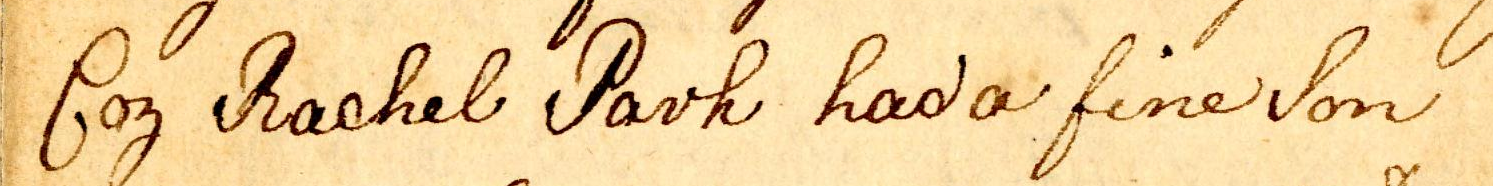Coz Rachel Park had a fine Son
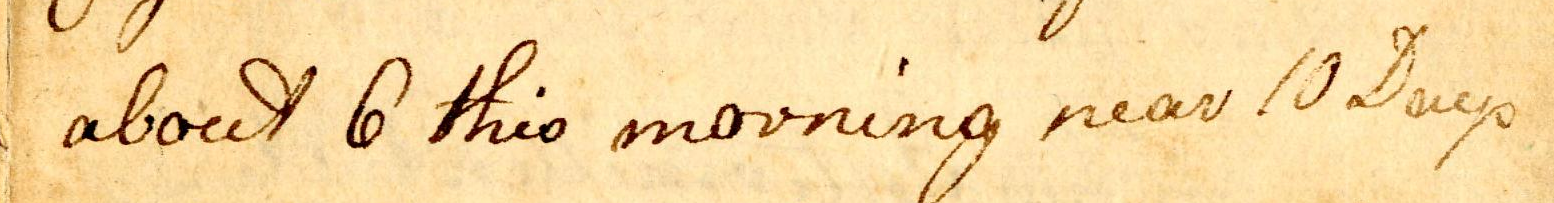about 6 this morning near 10 Days
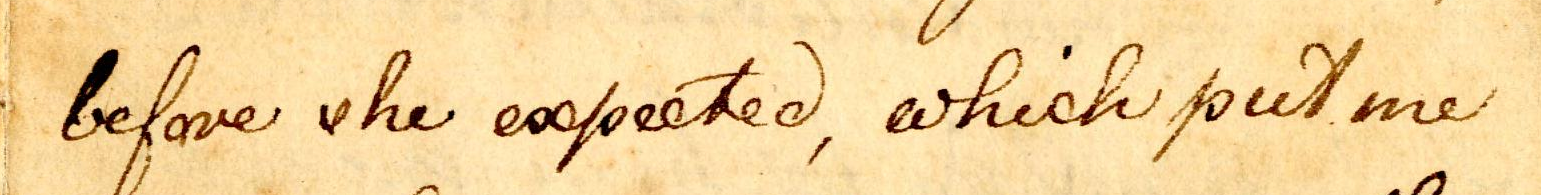before she expected, which put me
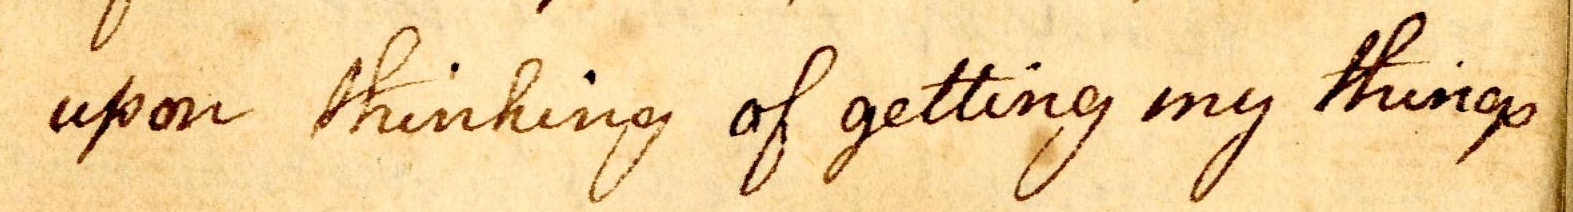upon thinking of getting my things
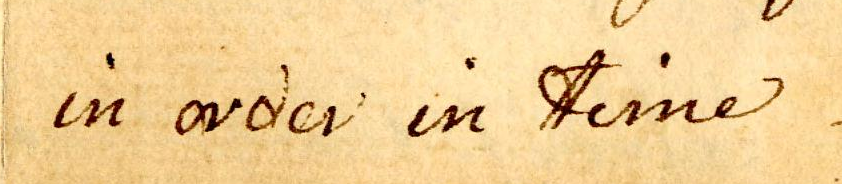in order in time
